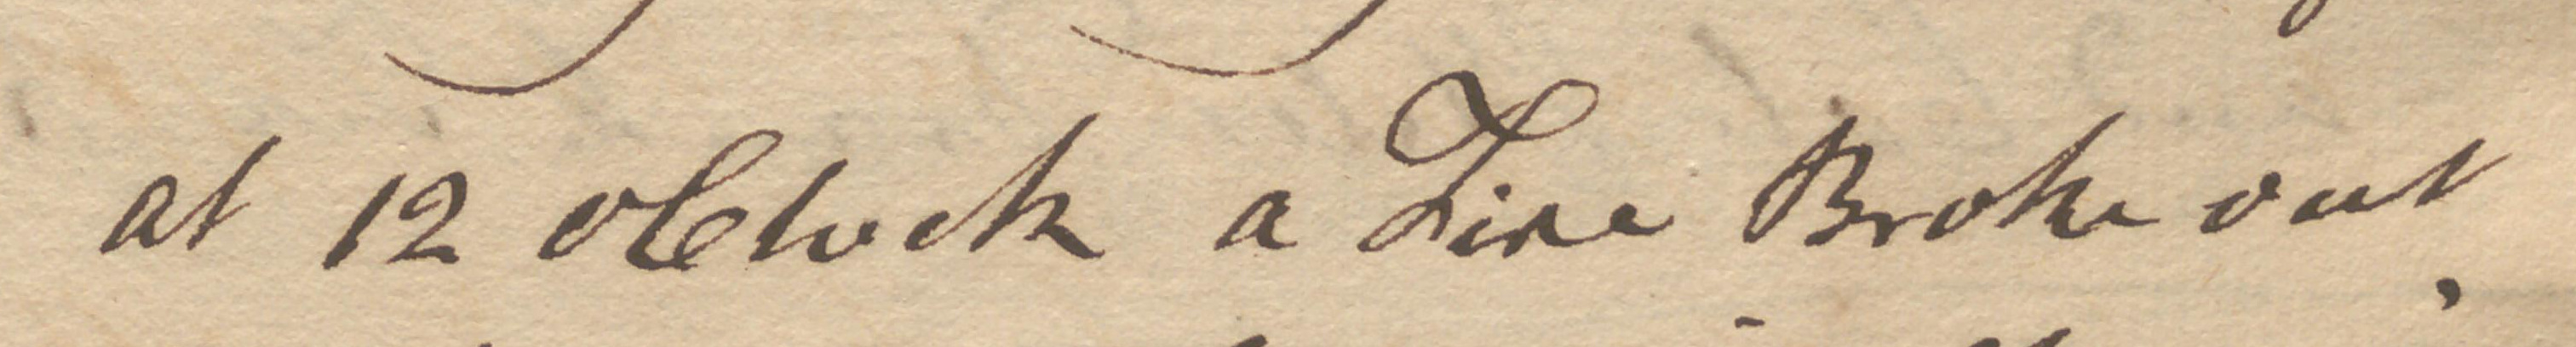at 12 oClock a Fire Broke out
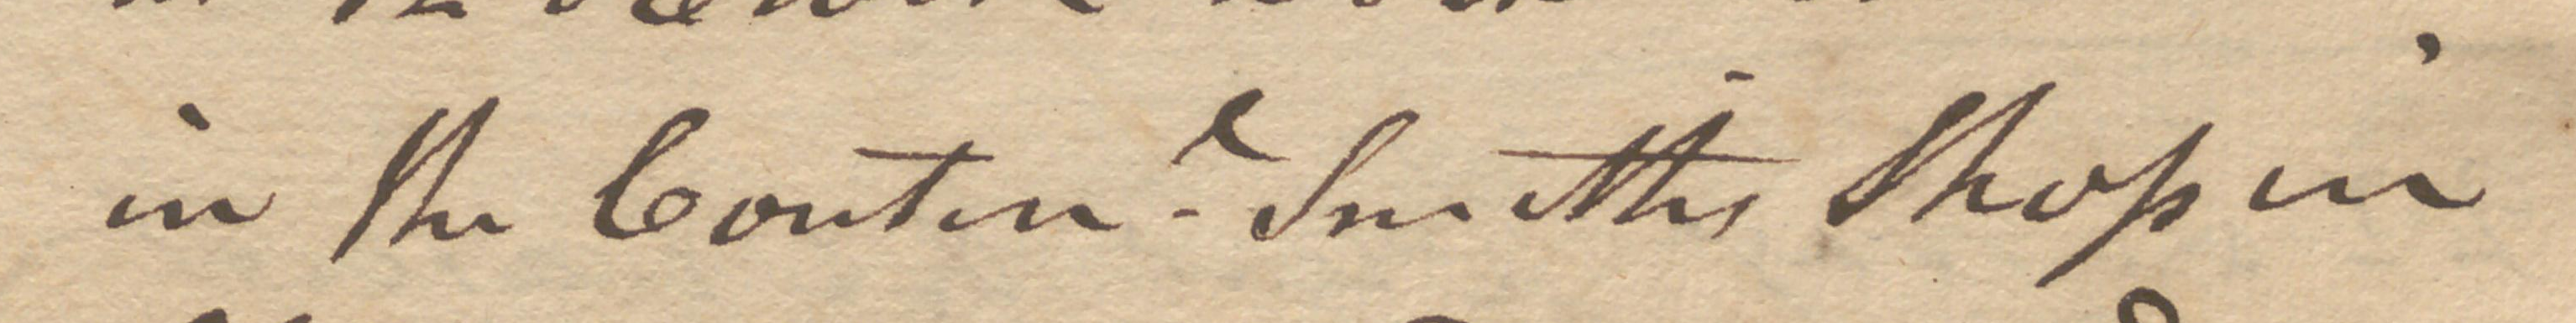in the Contin^l. Smiths Shop in
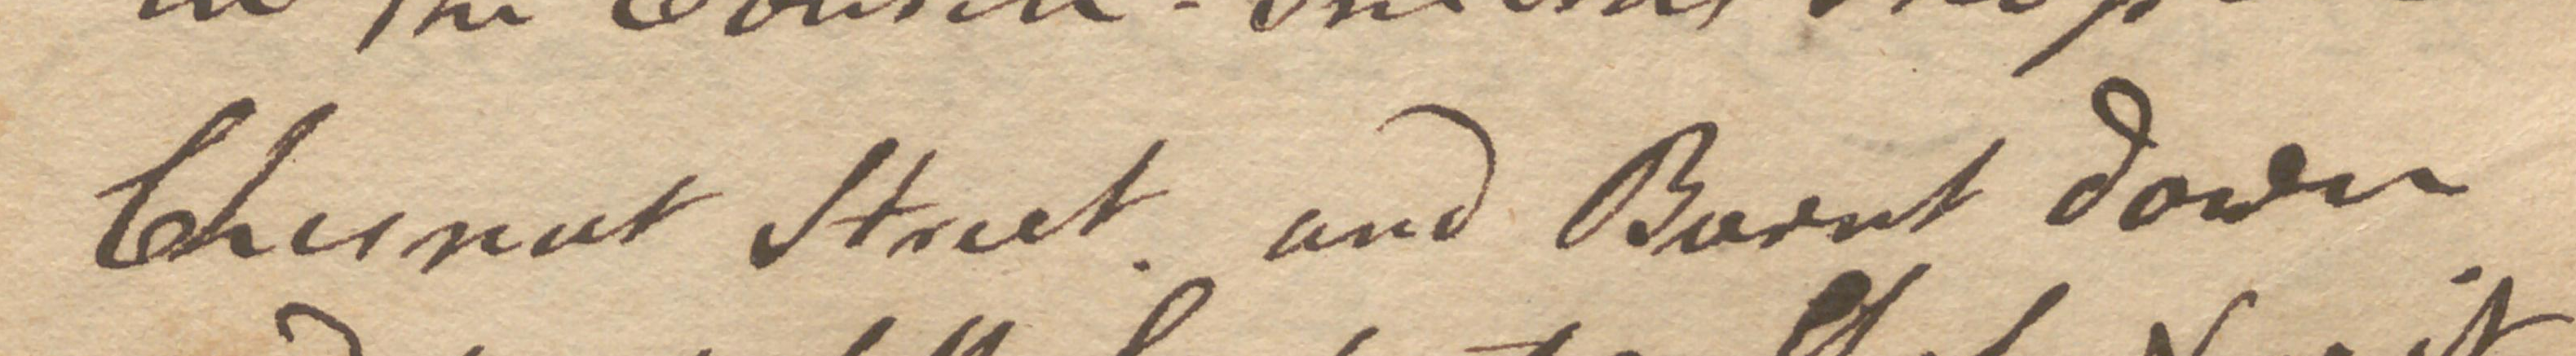Chesnut Street and Burnt down
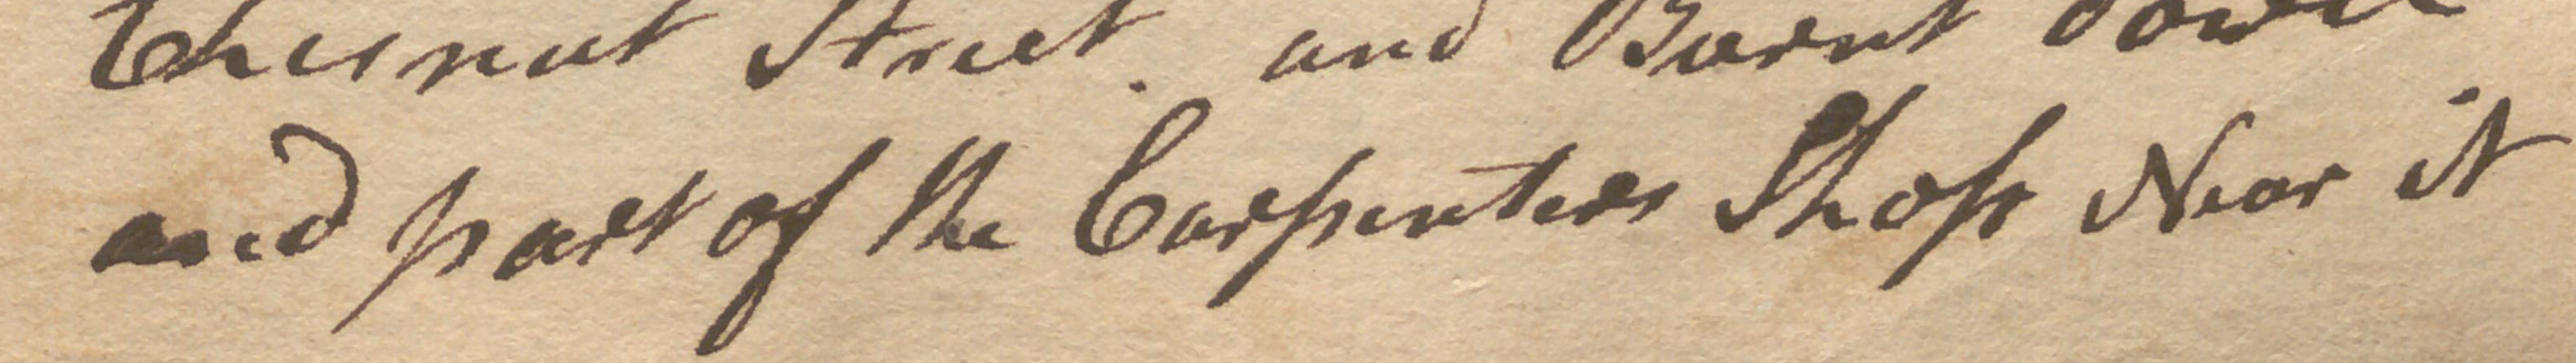and part of the Carpenters Shop Near it
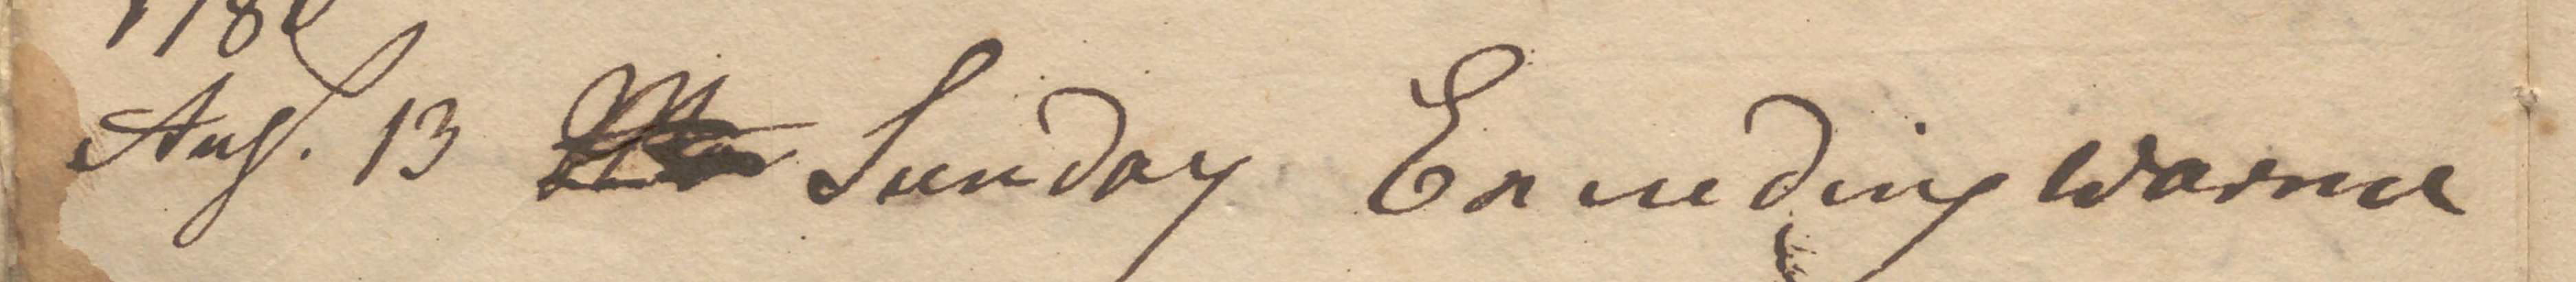Aug^t. 13 [Mo] Sunday Exceeding warme
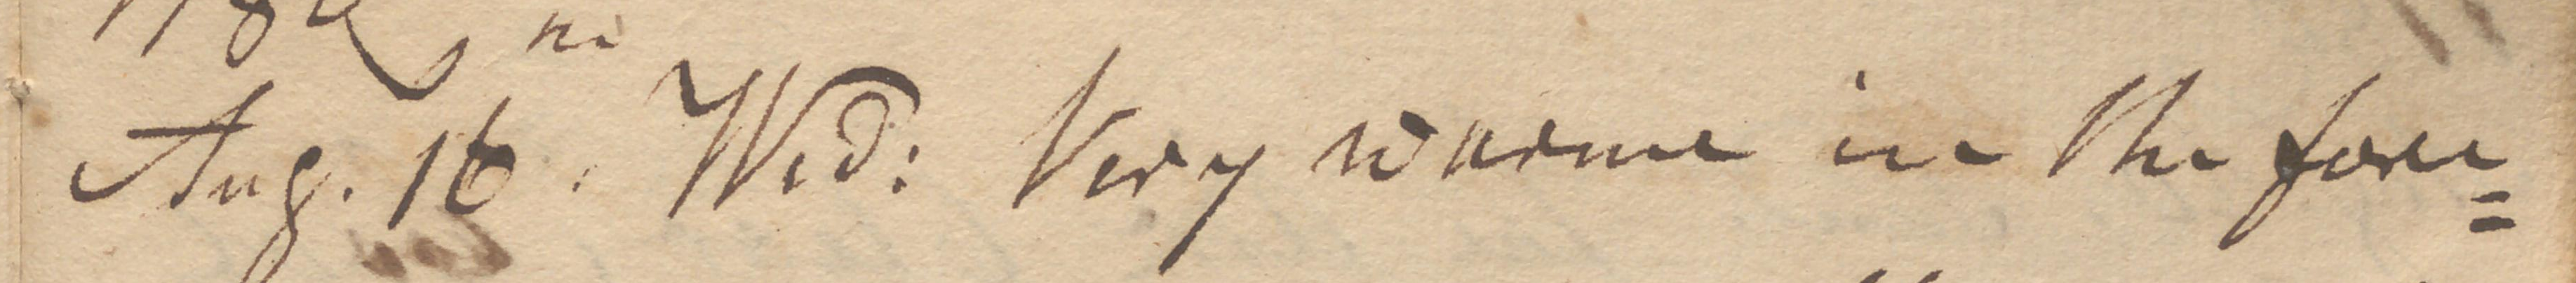Aug. 16. Wed. Very warme in the fore
